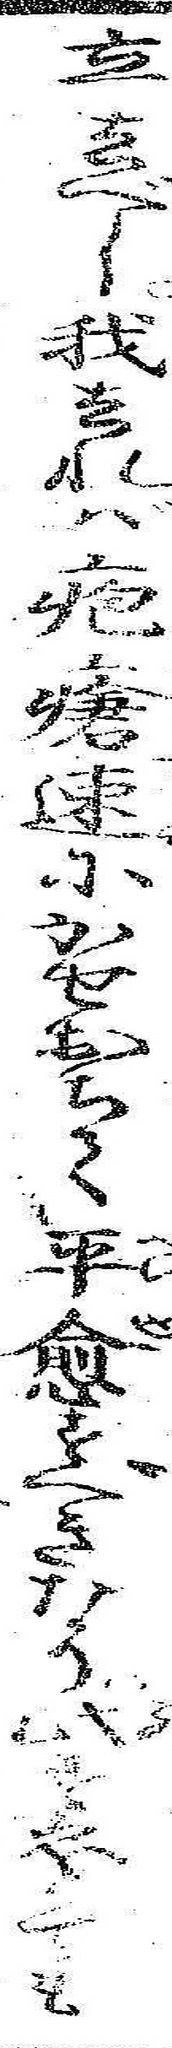立去べし。我去れば疱瘡速にかせおちて平癒すべきなり。此すゑとても
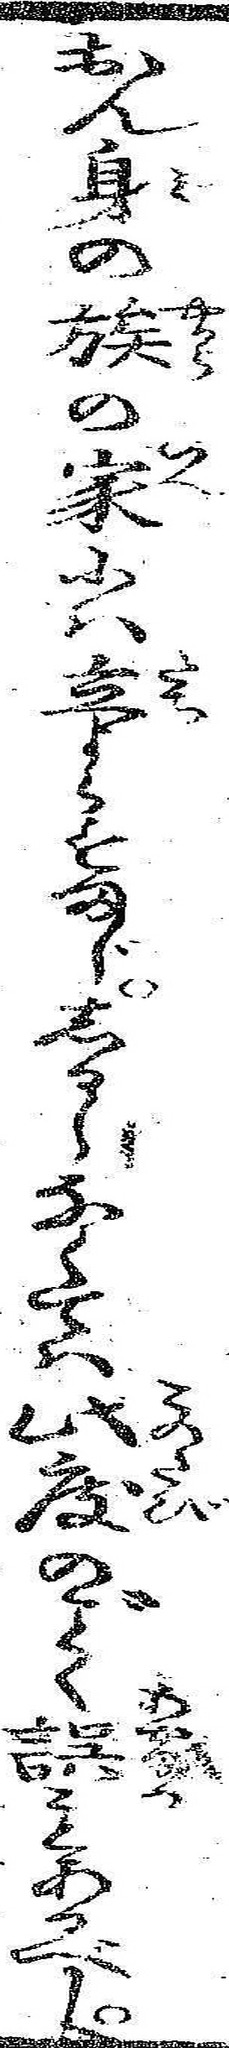おん身の族の家には立よらすまじ。しるしなくては此度のごとく誤ことあるべし。
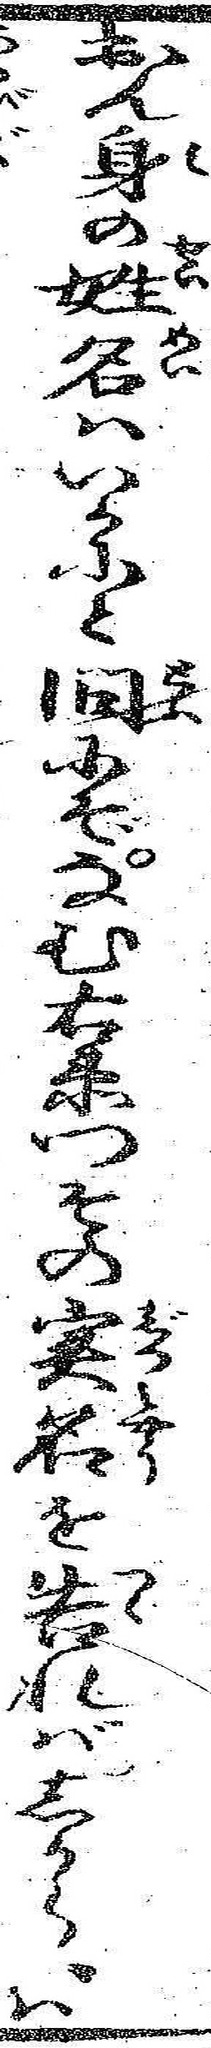おん身の姓名はいかにと問にぞ。なむ右衛門その実名を告れば。しからば
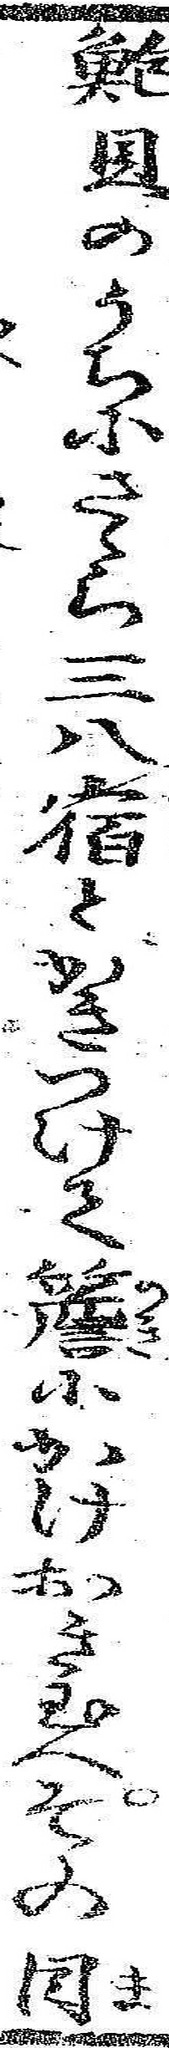鮑貝のうちにさゝら三八宿とかきつけて簷にかけおき玉へ。その目
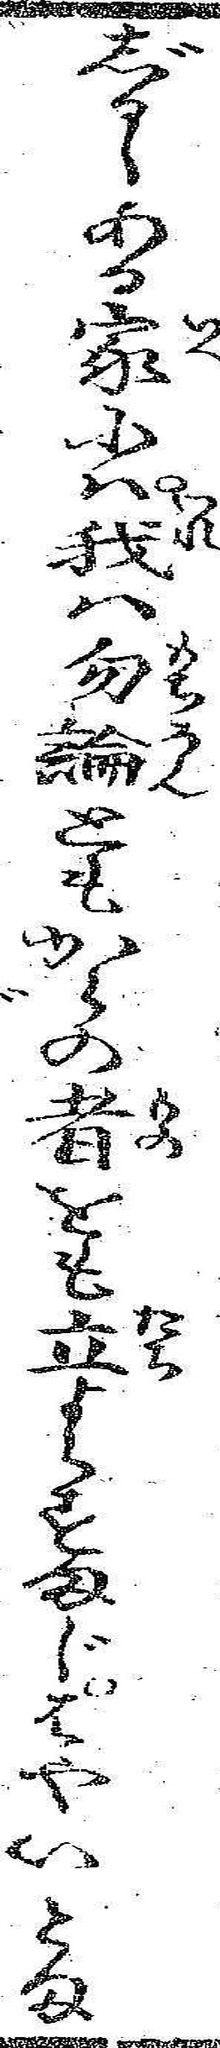じるしある家には。我は勿論ともからの者をも立よらすまじ。はやいとま
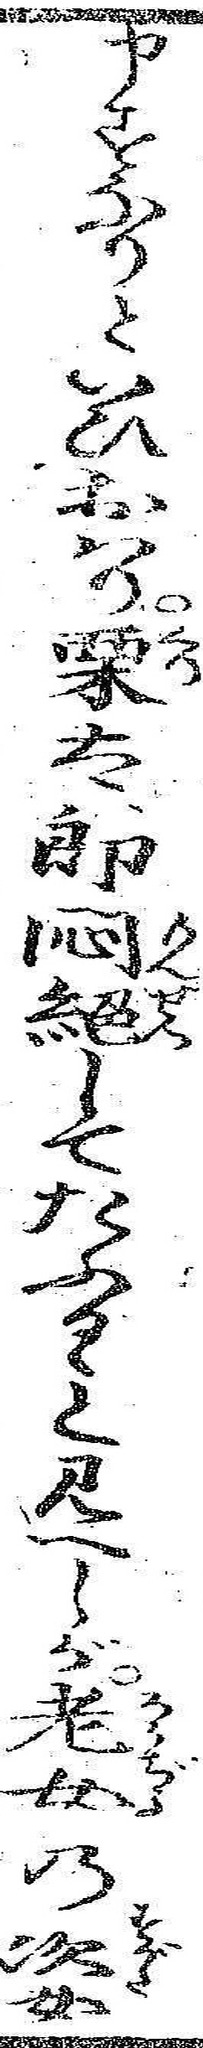申すなりといひおはり。栗太郎悶絶してたふるゝと見へしが。老女の姿
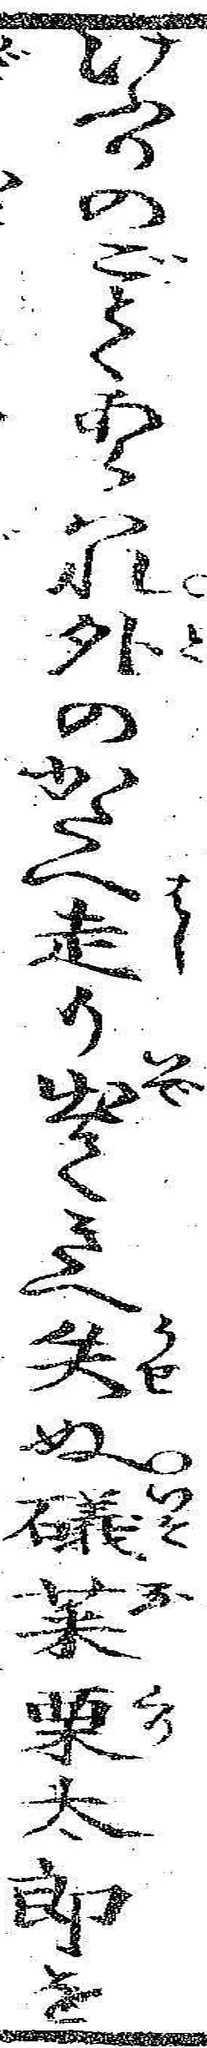けふりのごとくあらはれ。外のかたへ走り出てきへ失ぬ。礒菜栗太郎を
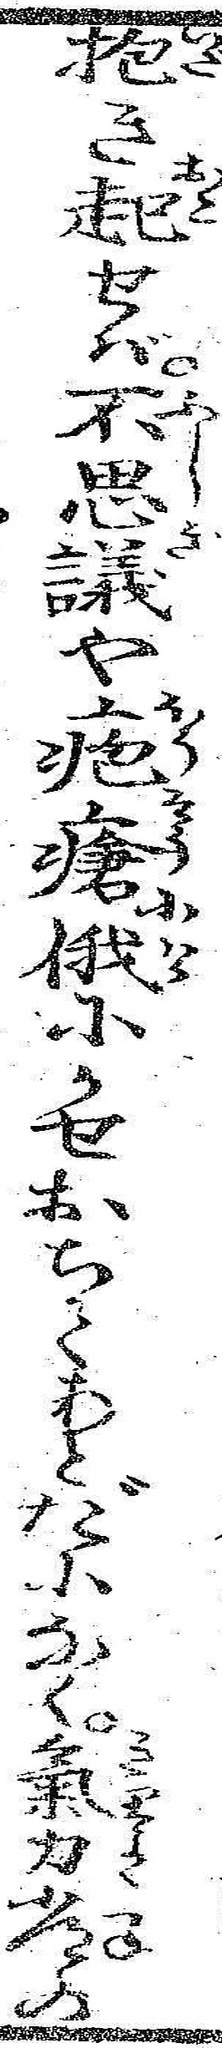抱き起せば。不思議や疱瘡俄にかせおちてあとだになく。気力常の
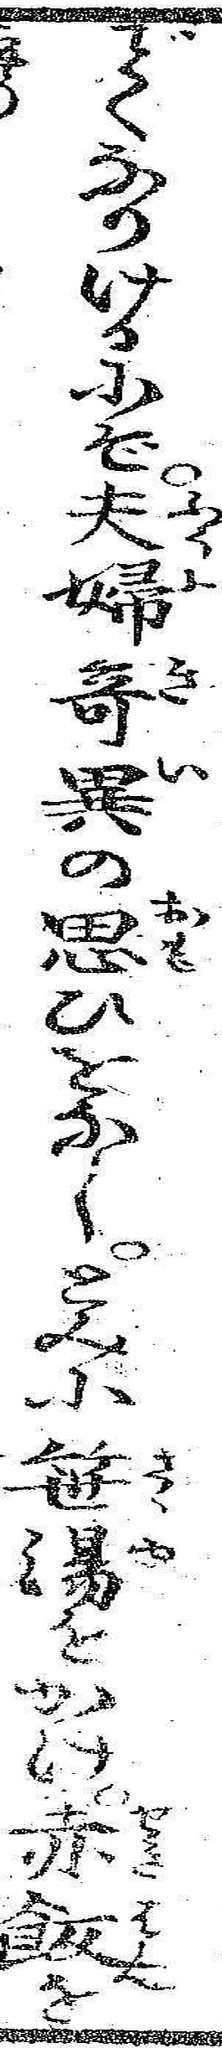ごとくなりけるにぞ。夫婦奇異の思ひをなし。とみに笹湯をかけ。赤飯を
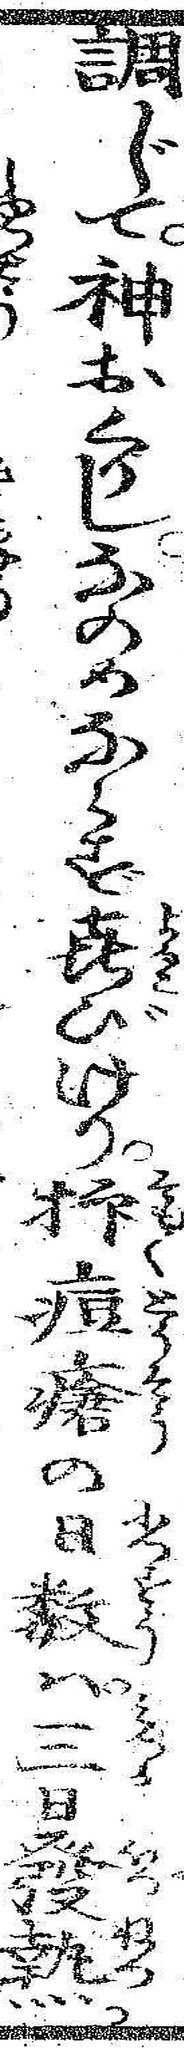調じて。神おくりし。なのめならず喜びけり。抑痘瘡の日数は。三日発熱。
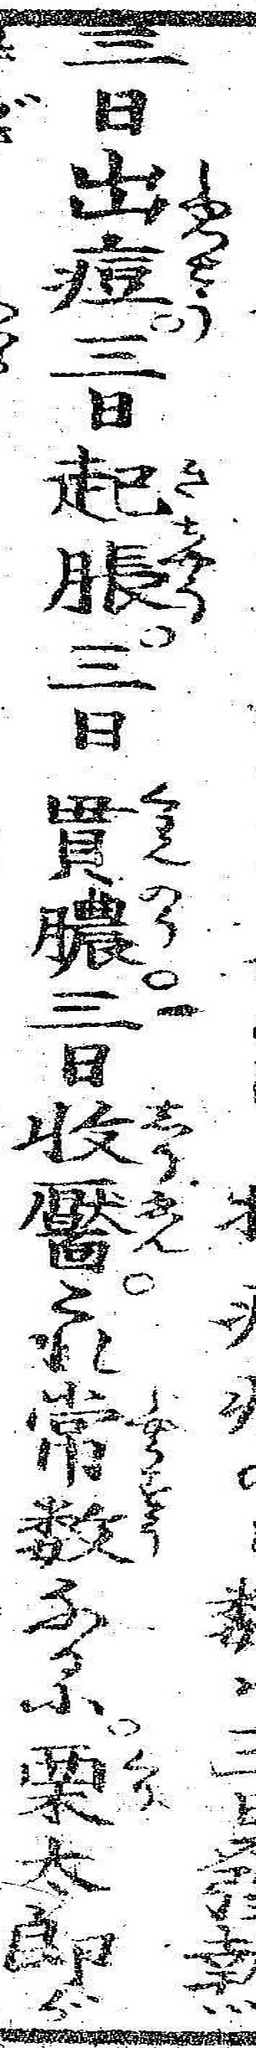三日出痘。三日起脹。三日貫膿。三日収靨。これ常数なるに。栗太郎が
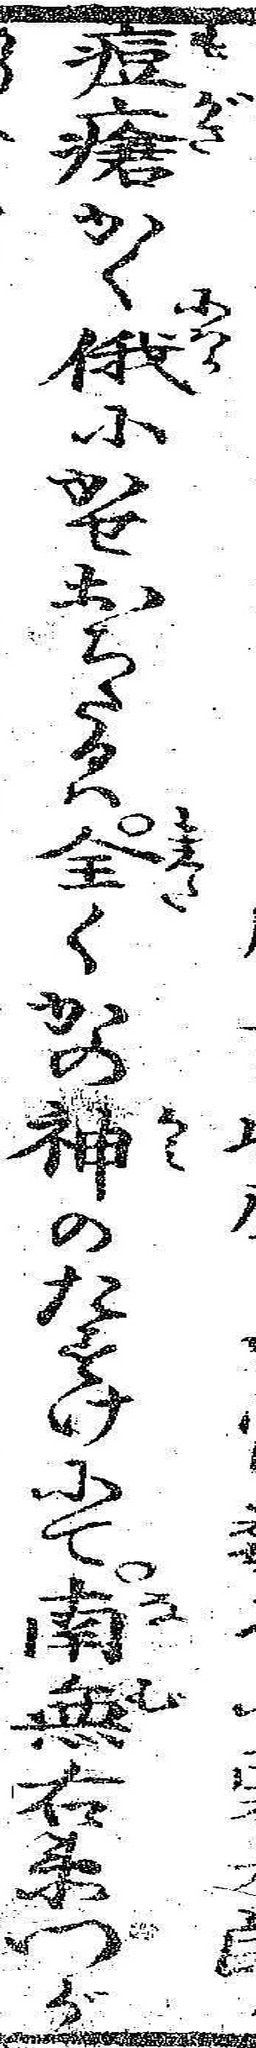痘瘡かく俄にかせおちたるは。全くかの神のたすけにて。南無右衛門が
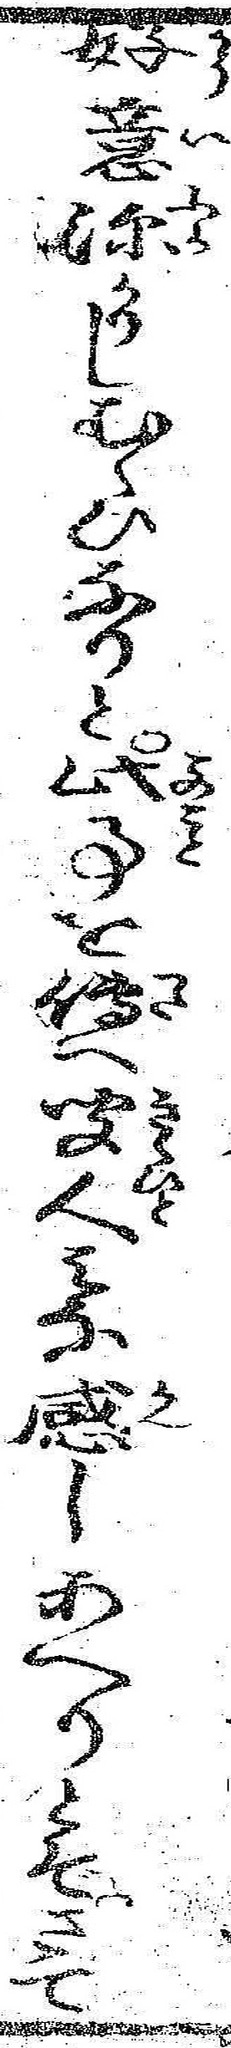好意深かりしむくひなりと。此事を伝へ聞人みな感しあへりとぞ。さて

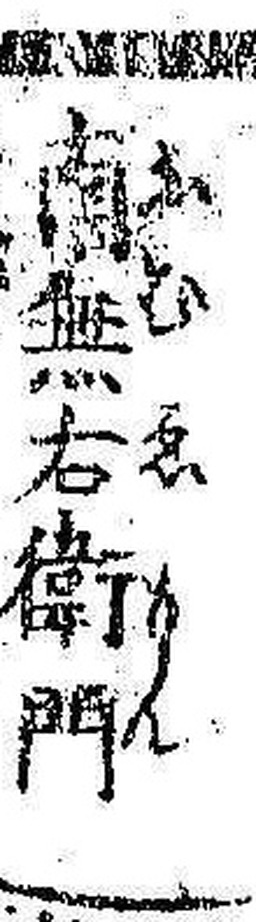南無右衛門
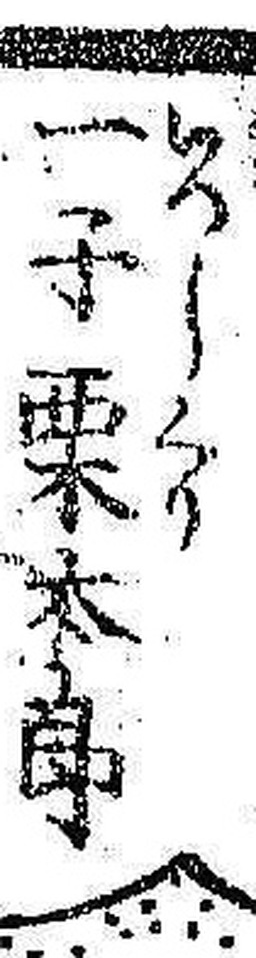一子栗太郎
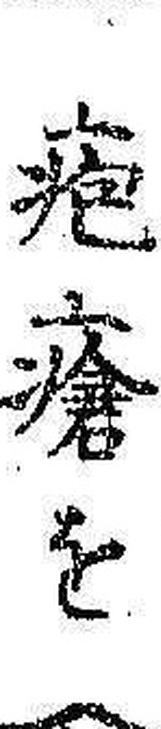疱瘡を
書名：昔話稲妻表紙
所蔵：国文学研究資料館
